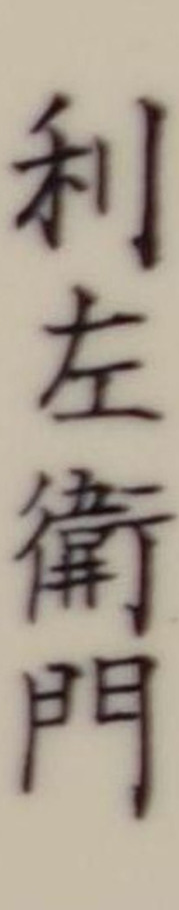利左衛門
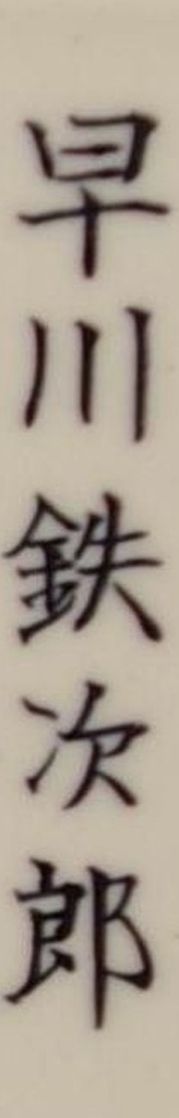早川鉄次郎
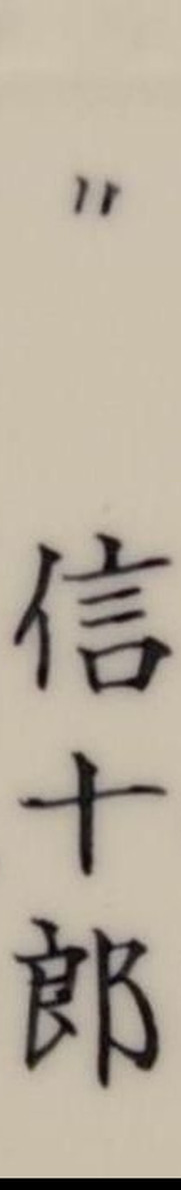信十郎
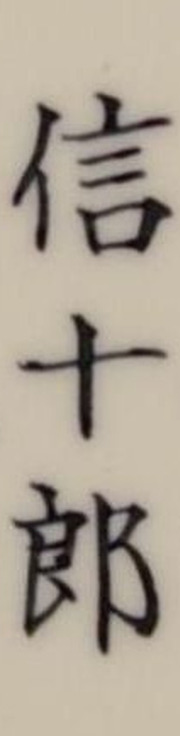信十郎
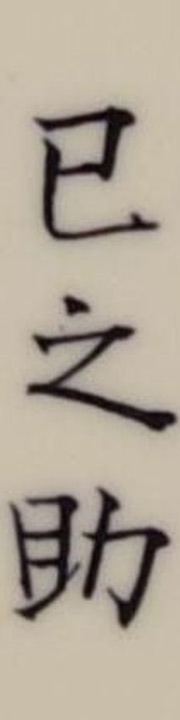巳之助
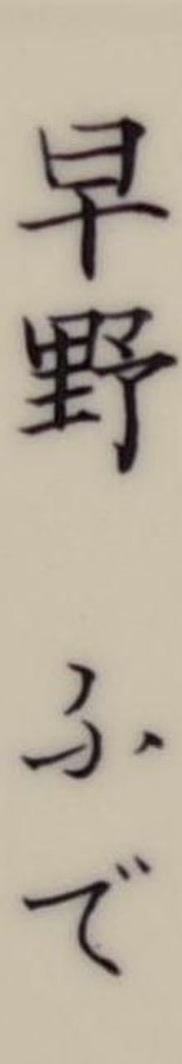早野ふで
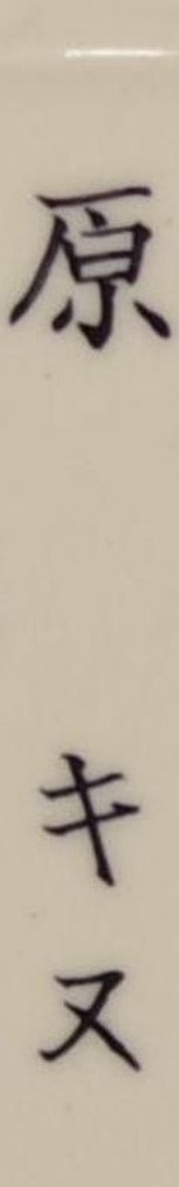原キヌ
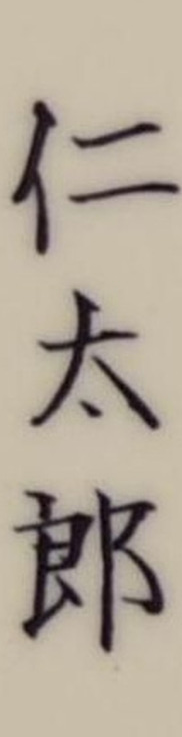仁太郎
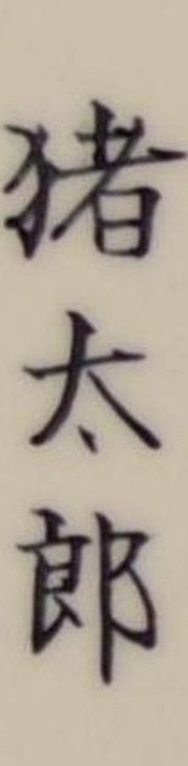猪太郎
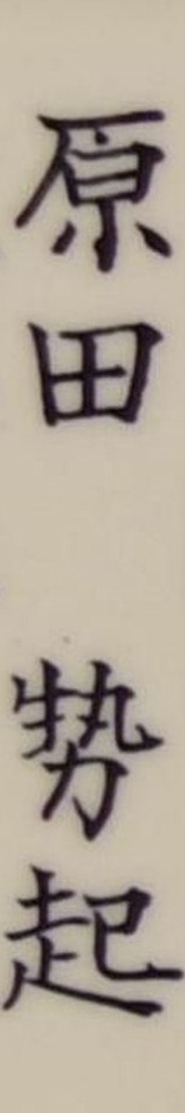原田勢起
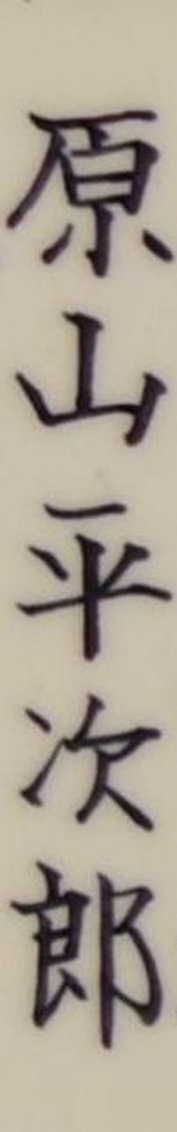原山平次郎
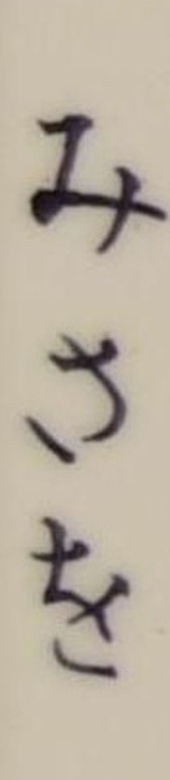みさを

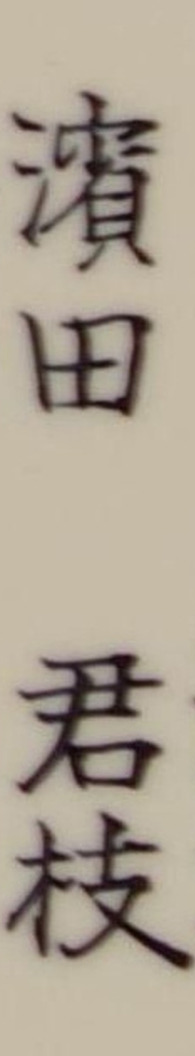濱田君枝
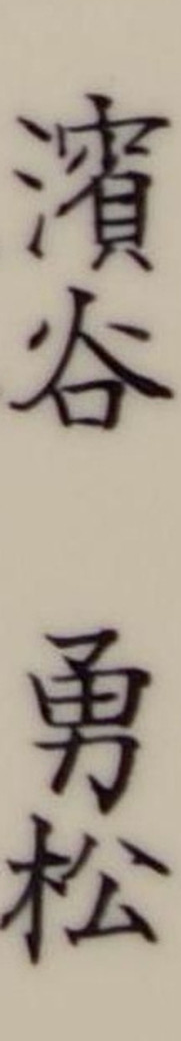濱谷勇松
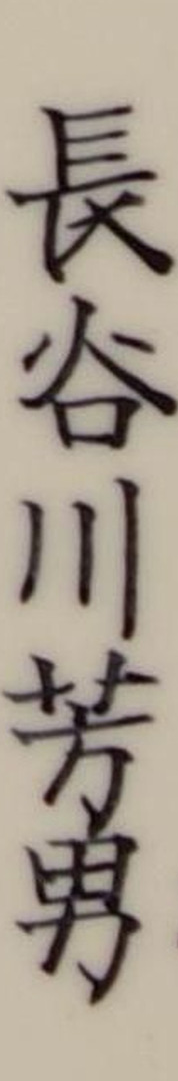長谷川芳男
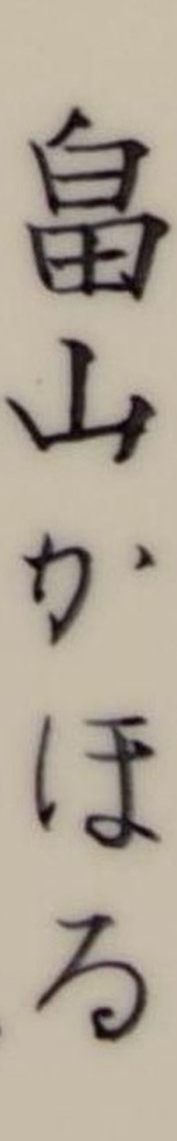畠山かほる
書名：M~S
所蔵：高野山金剛峯寺
